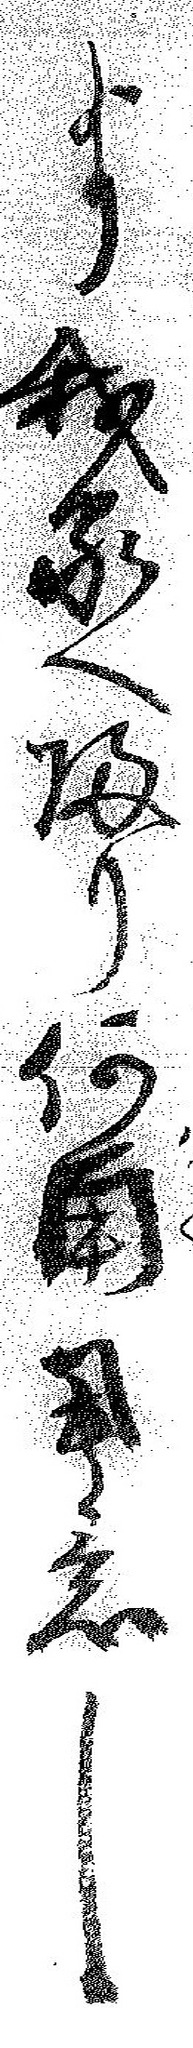より我家へ帰り何角用意し
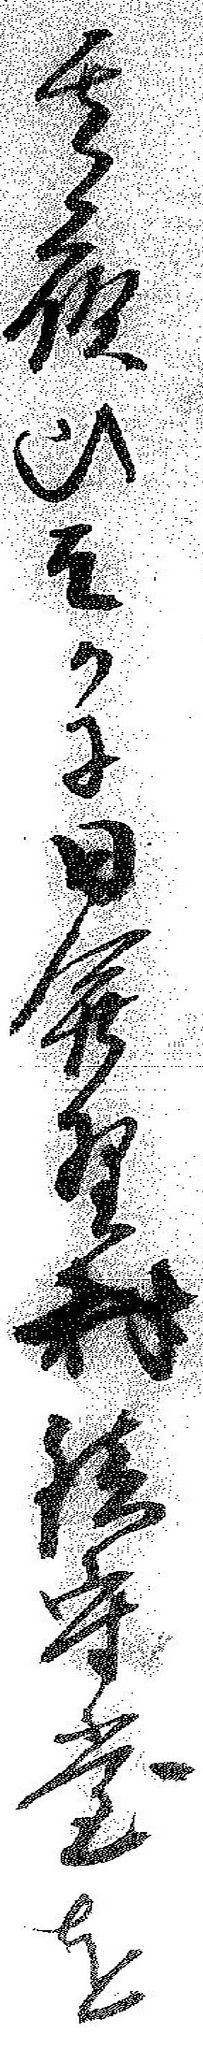其夜ひそかに日開野村鎮守堂を
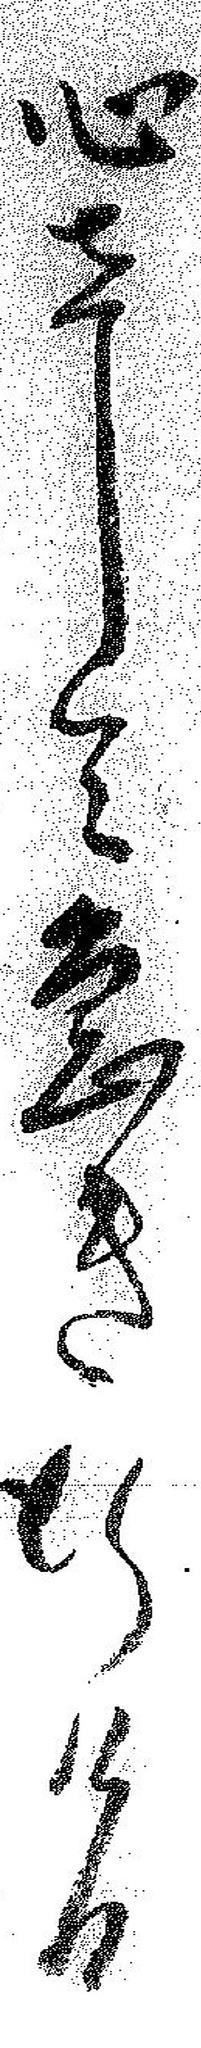心さして急き行ける
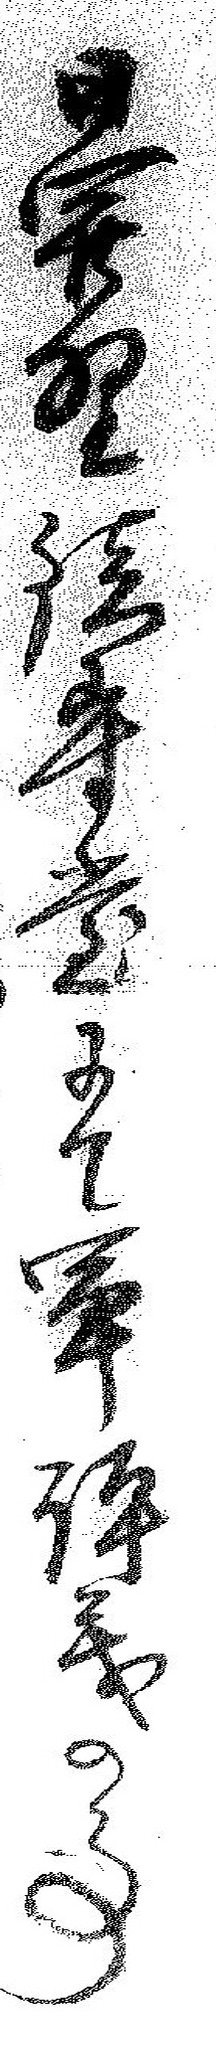日開野鎮守堂にて軍評義の事
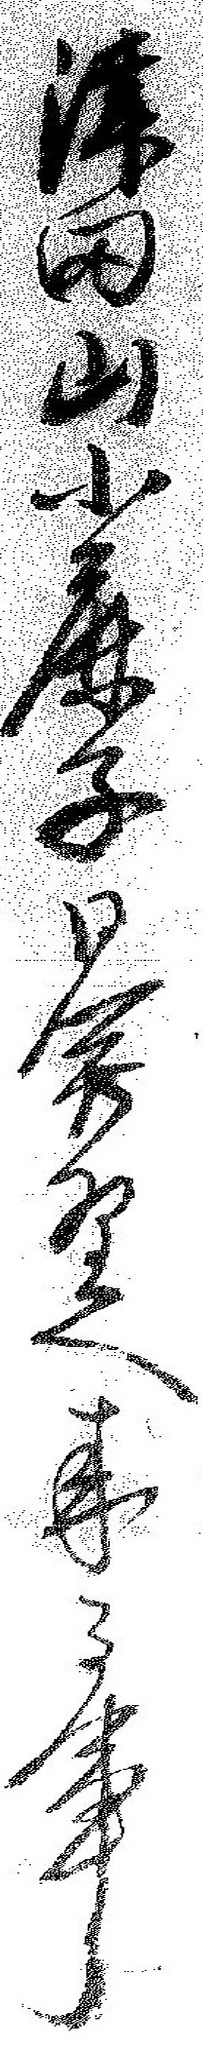津田山小鹿子日開野へ来る事
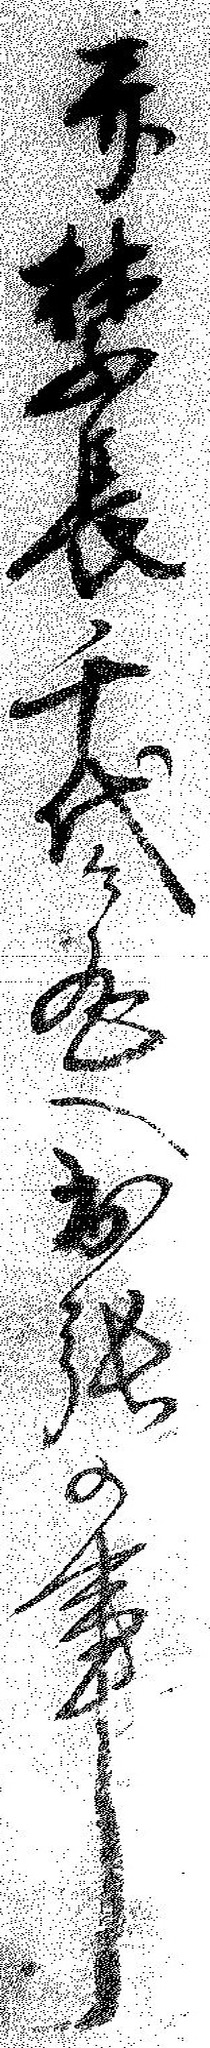并禁長千代ヶ丸へ出張の事

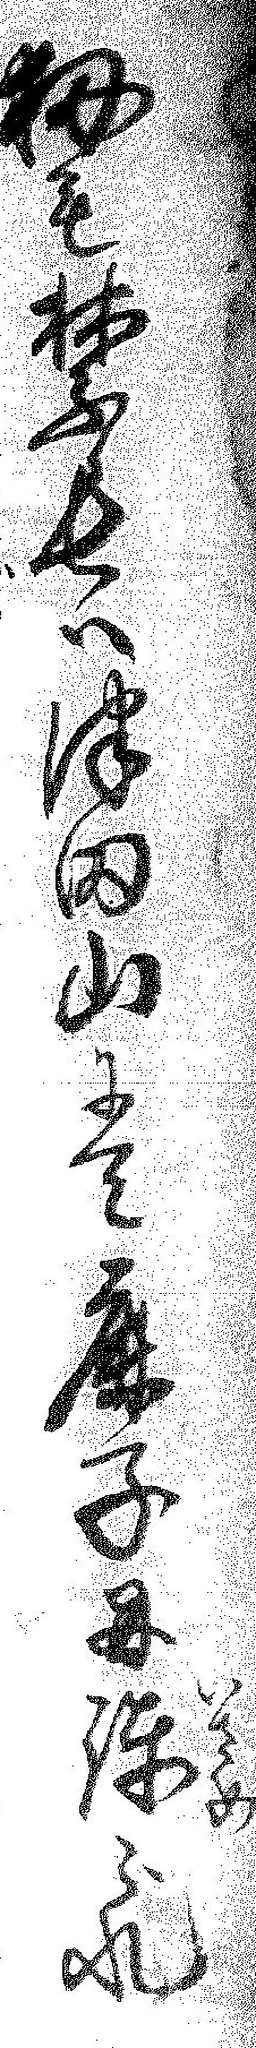扨も禁長は津田山にて鹿子に諫られ
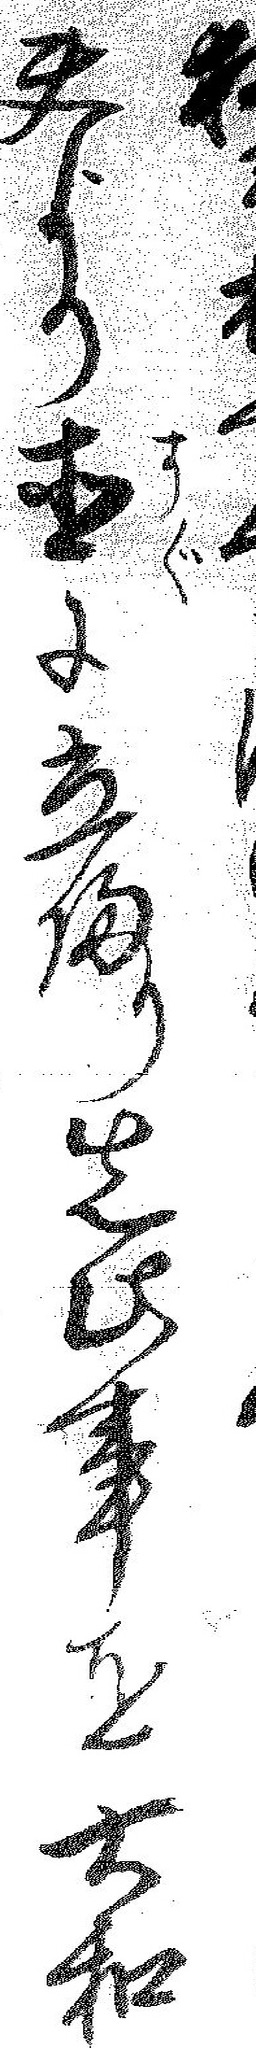夫より直に立帰り先此事を大和
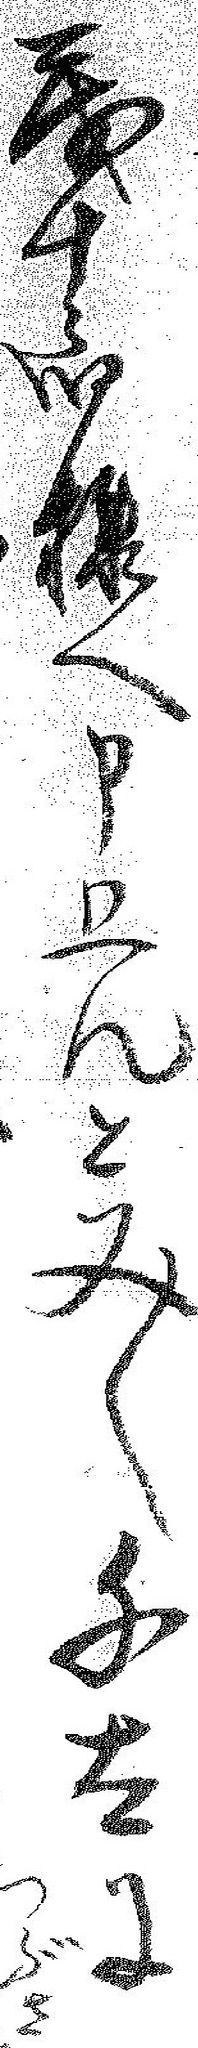茂十郎様へ申上んと又〳〵千太に
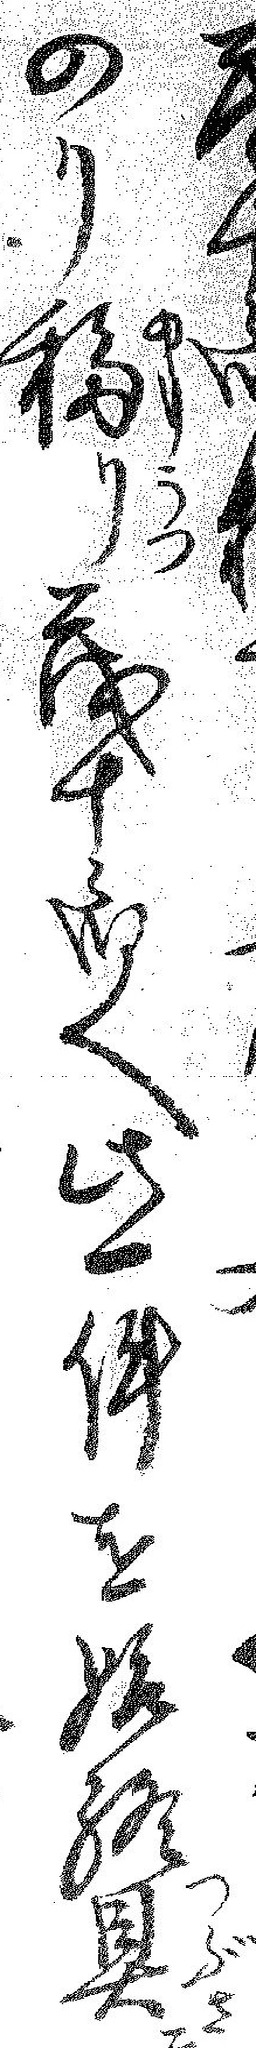のり移り茂十郎へ此一件を始終具
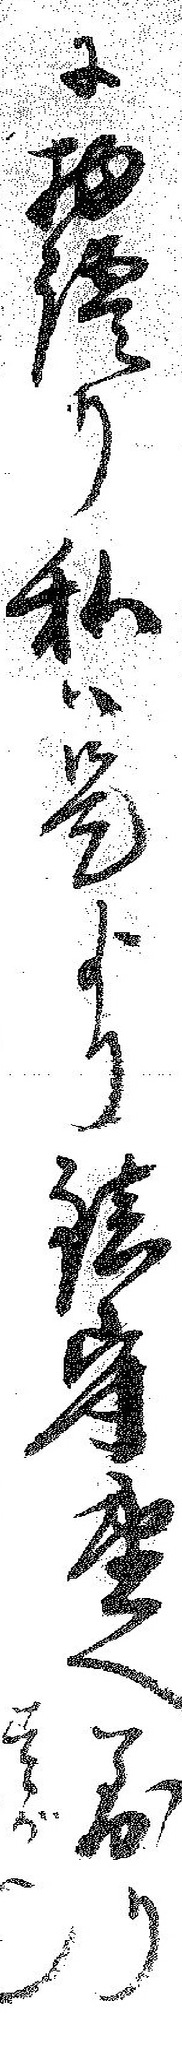に物語り私は是より鎮守堂へ至り
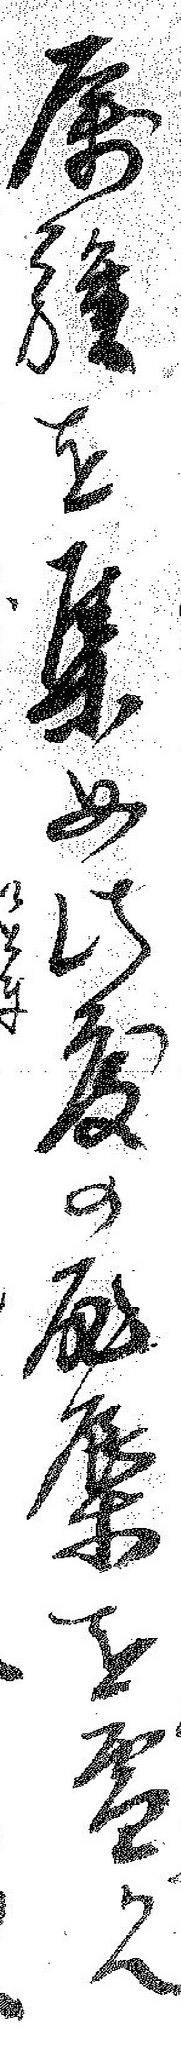属族を集め此度の恥辱を雪がん
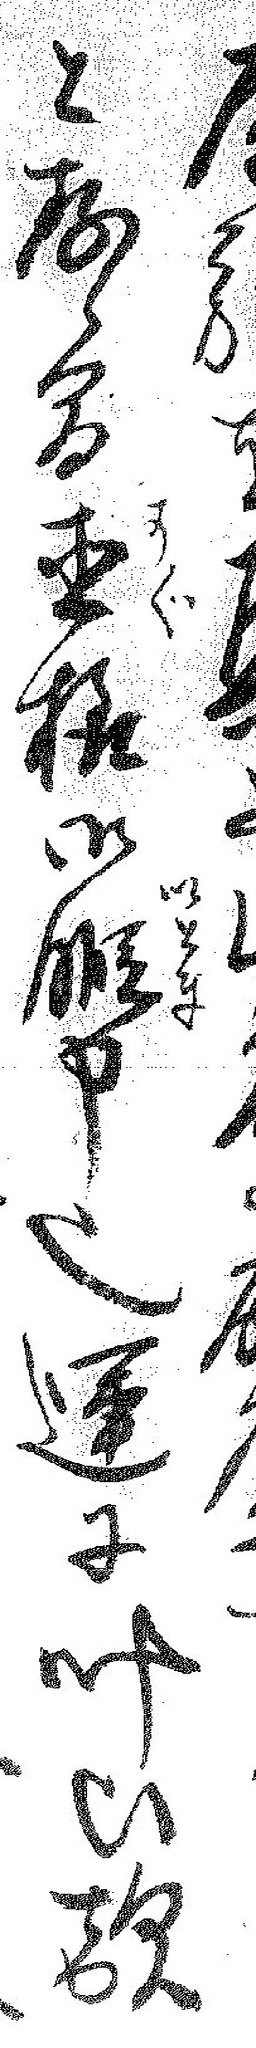と存候間直様御暇申也運に叶ひ敵
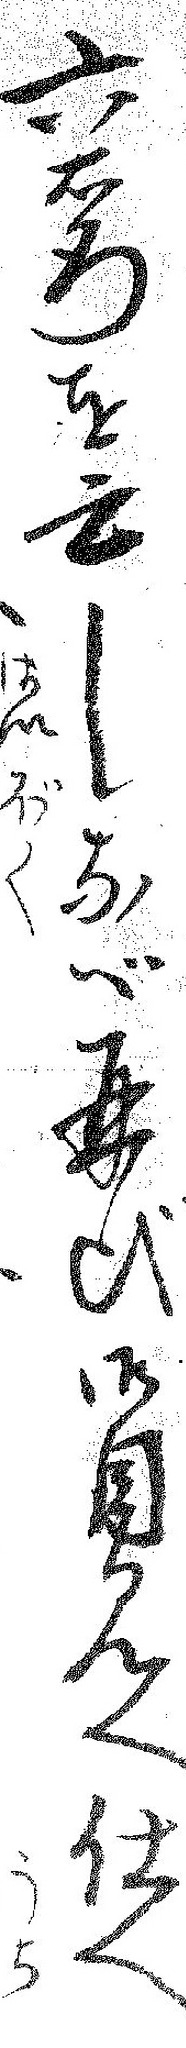六右衛門を亡しなば再び御目見へ仕へ
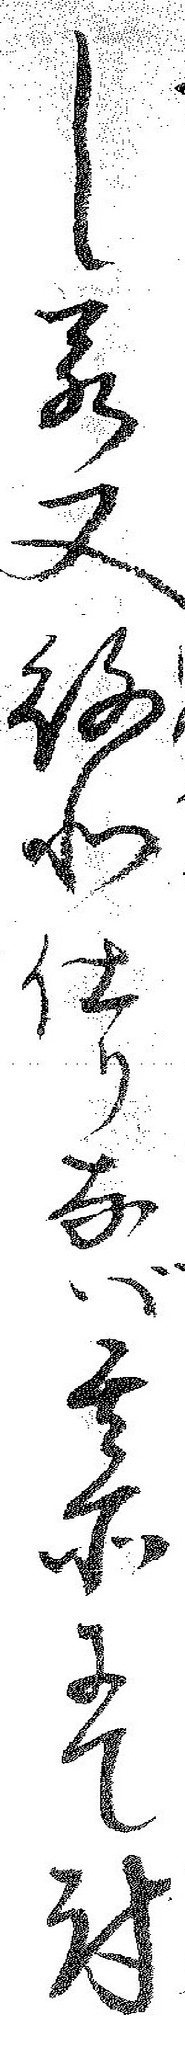し若又敗北仕りなば其所にて討
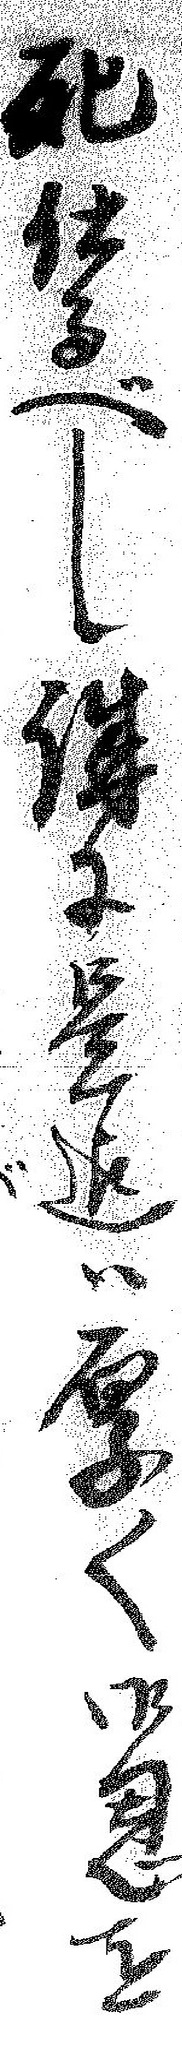死仕るべし誠に是迄は厚く御恩を
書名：近頃古狸珍説　礼義智信
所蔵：徳島県立図書館
